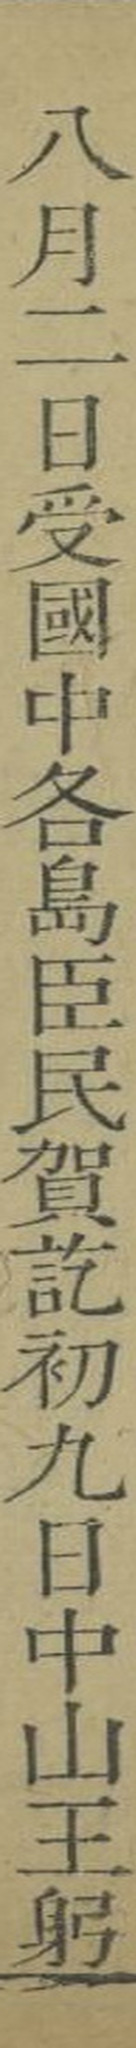八月二日受國中各島臣民賀訖初九日中山王躬
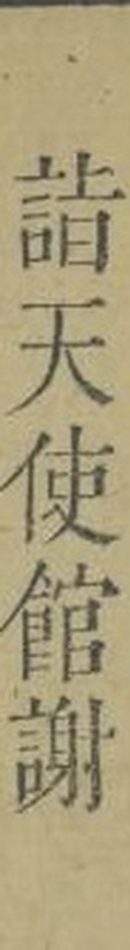詣天使館謝
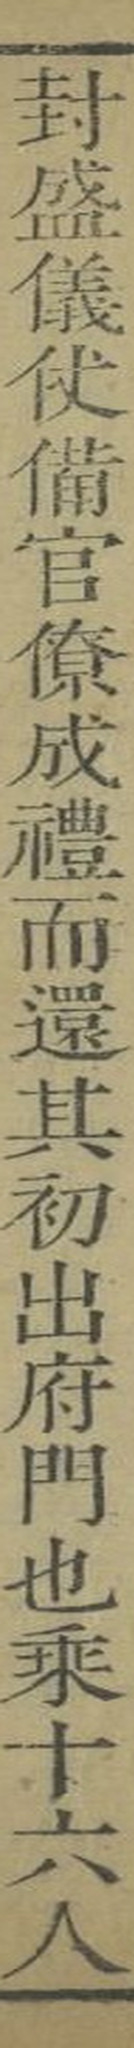封盛儀仗備官僚成禮而還其初出府門也乘十六人
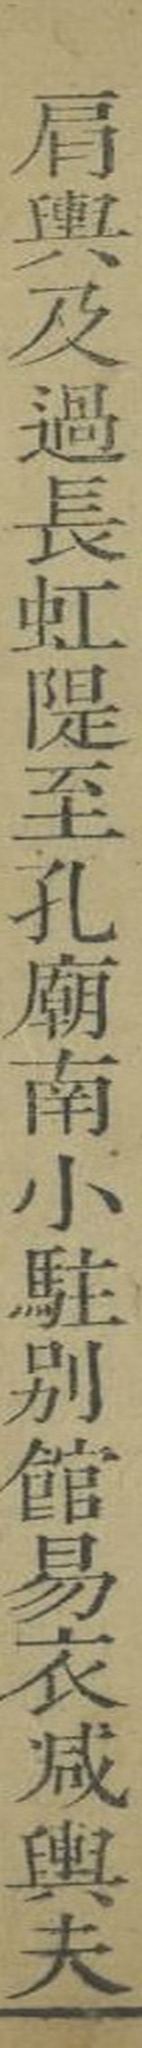肩輿及過長虹隄至孔廟南小駐別館易衣減輿夫
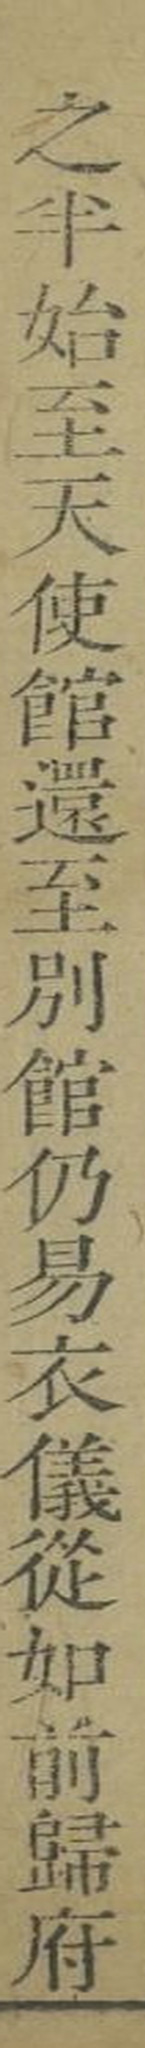之半始至天使館還至別館仍易衣儀從如前歸府
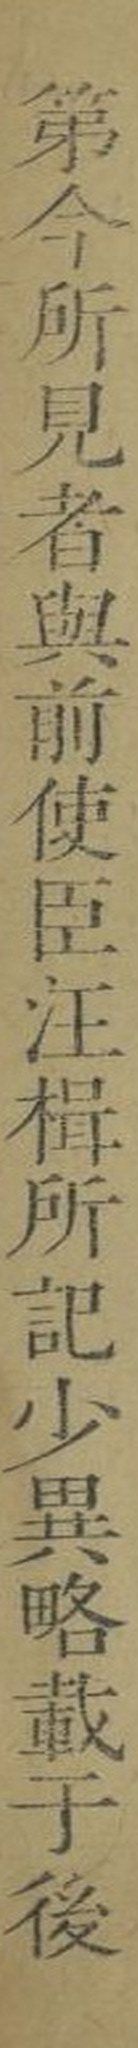第今所見者與前使臣汪楫所記少異略載于後

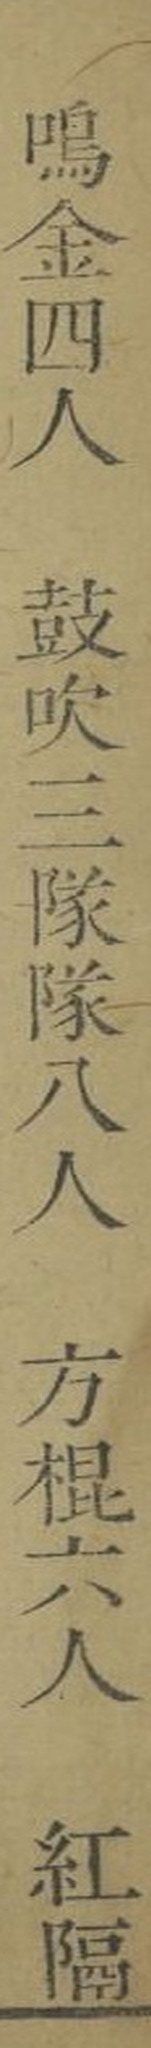鳴金四人鼓吹三隊隊八人方棍六人紅隔
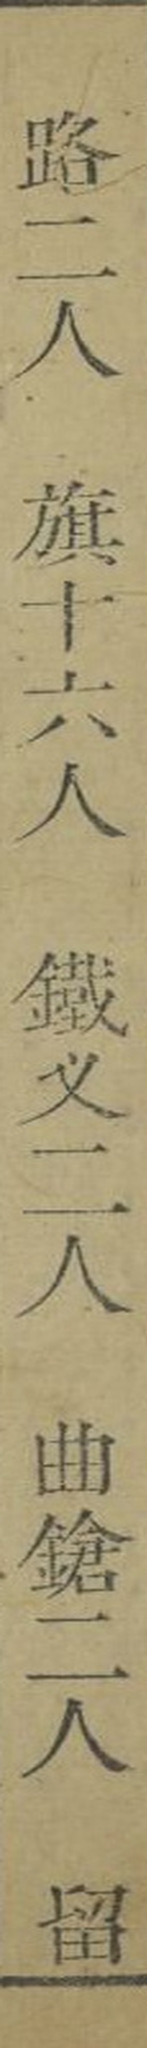路二人旗十六人鐵义二人曲鎗二人留
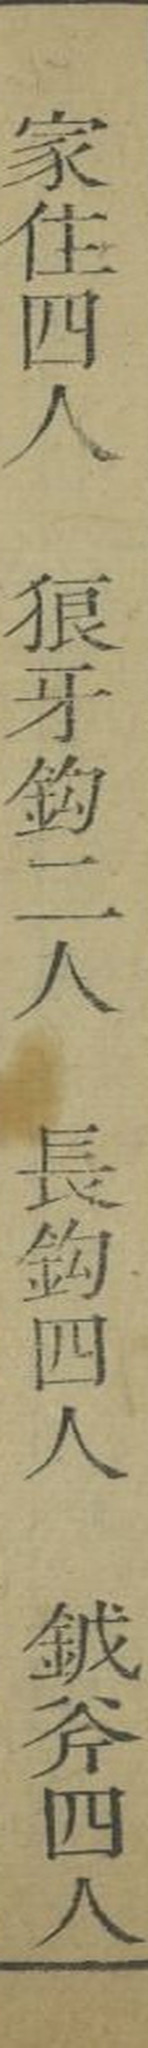家住四人狼牙鈎二人長鈎四人鉞斧四人
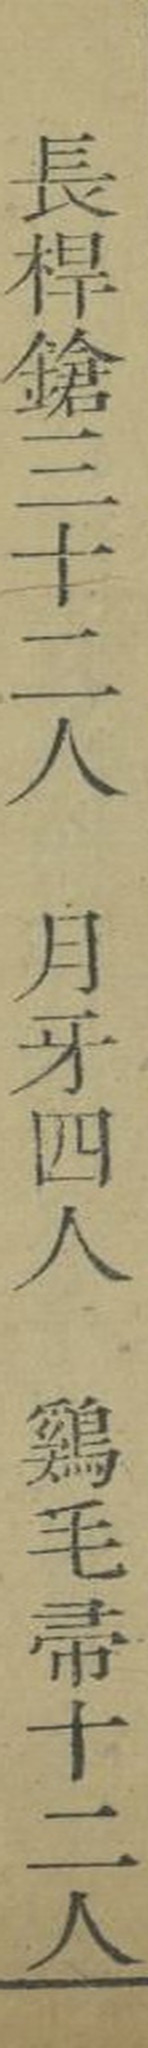長桿鎗三十二人月牙四人鷄毛帚十二人
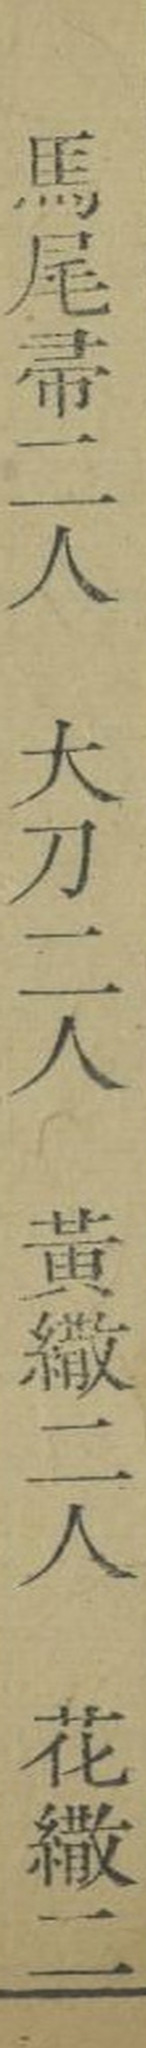馬尾帚二人大刀二人黃繖二人花繖二
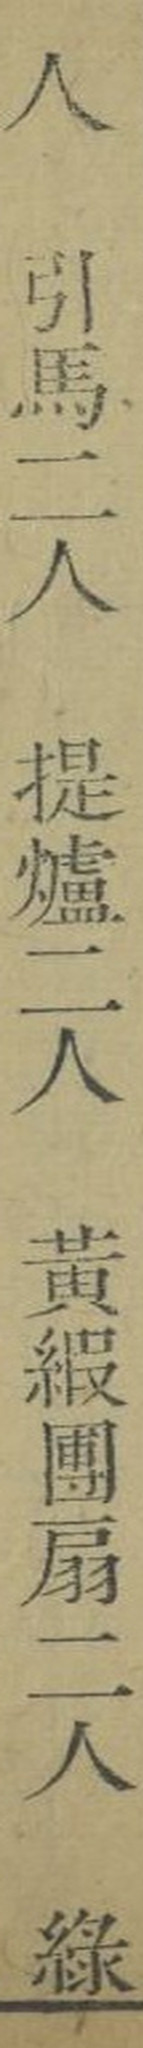人引馬二人提爐二人黃縀團扇二人綠
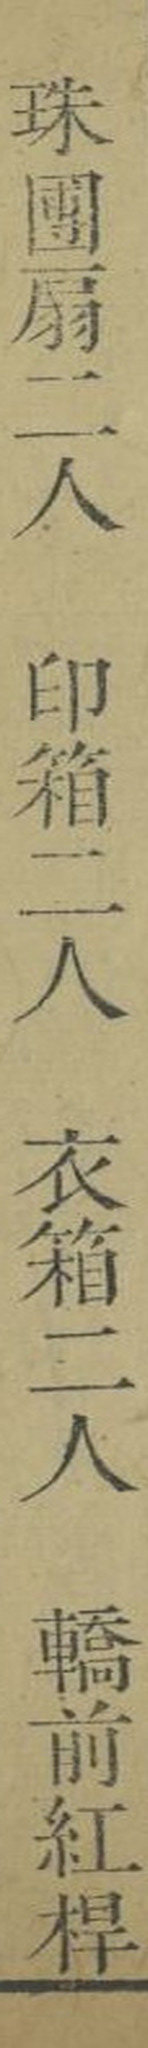珠團扇二人印箱二人衣箱二人轎前紅桿
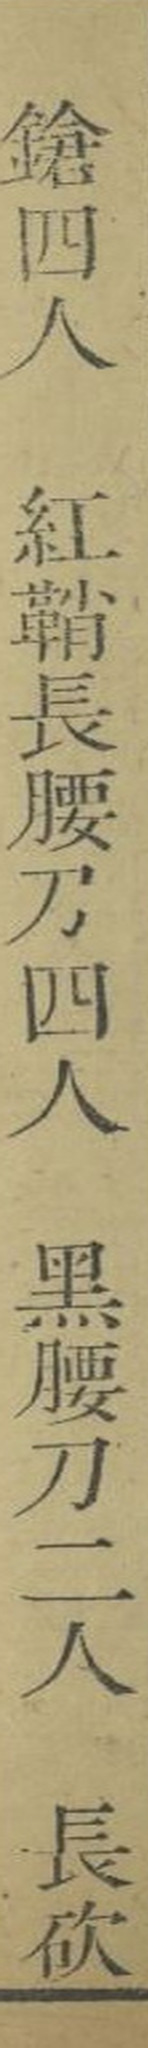鎗四人紅鞘長腰刀四人黑腰刀二人長砍
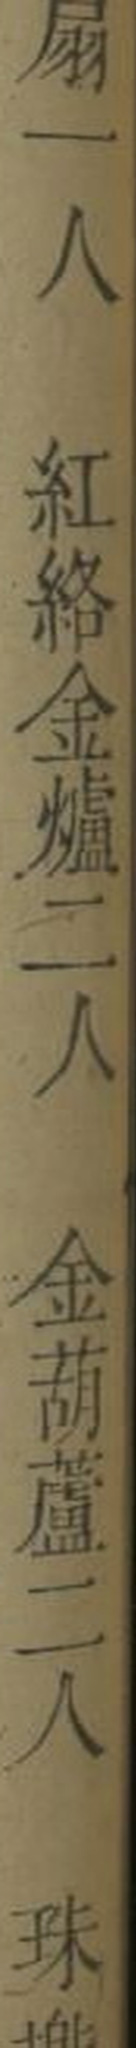扇一人紅絡金爐二人金葫蘆二人珠兠扇
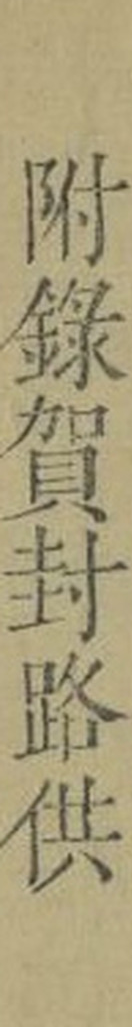附錄賀封路供
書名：中山伝信録 巻二
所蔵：University of the Ryukyus Library
